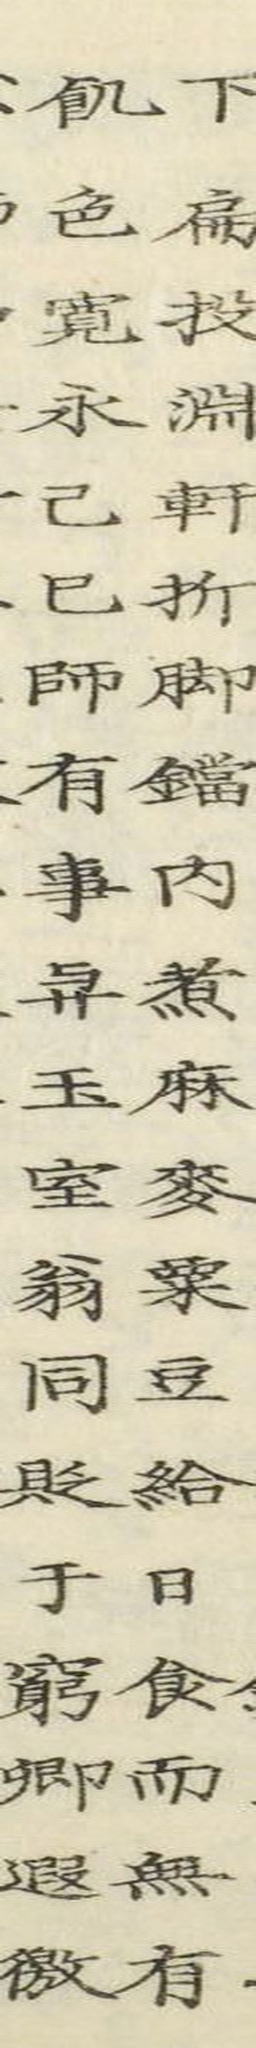飢色寛永己巳師有事玉室翁同貶于窮卿遐徼
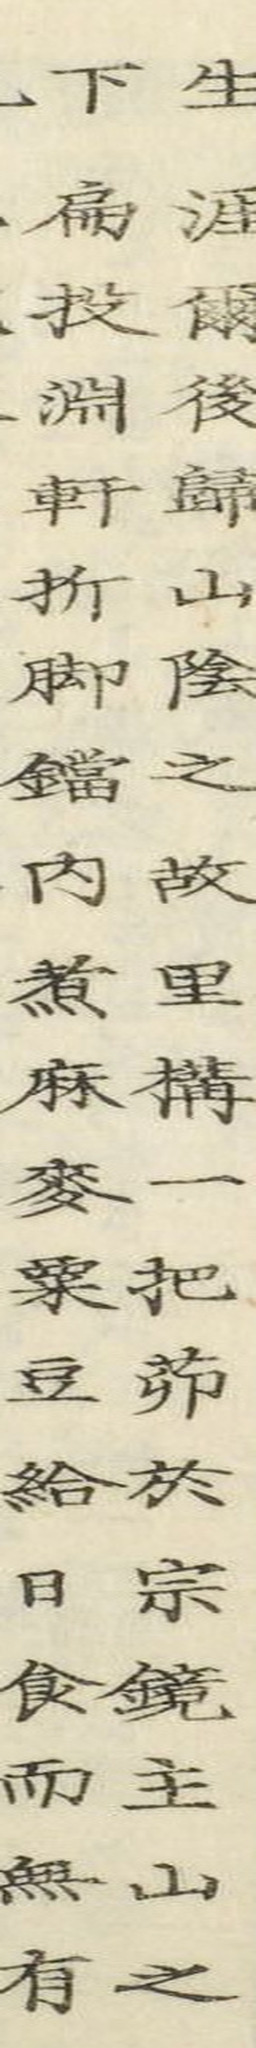下扁投淵軒折脚鐺内煮麻麥粟豆給日食而無有
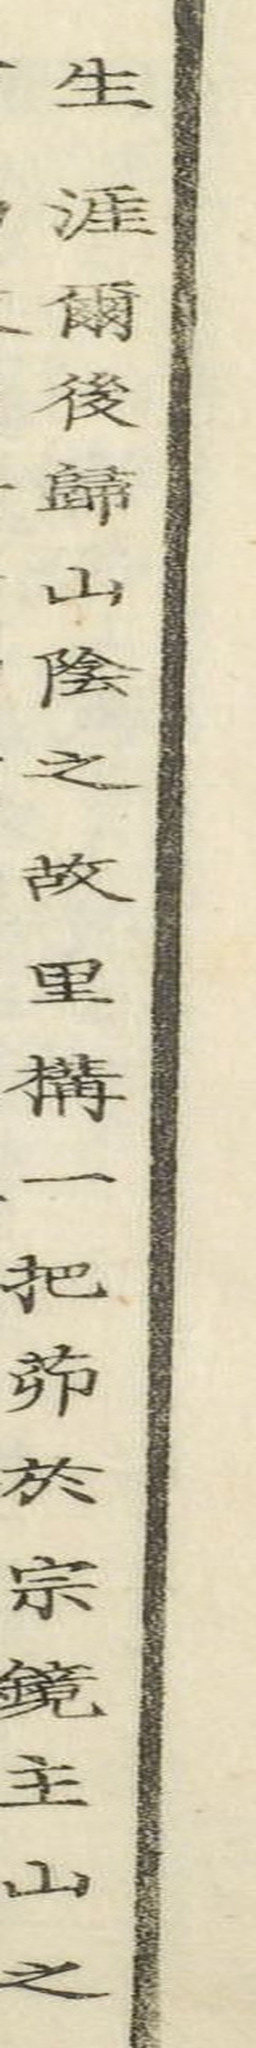生涯爾後歸山陰之故里構一把茆於宗鏡主山之
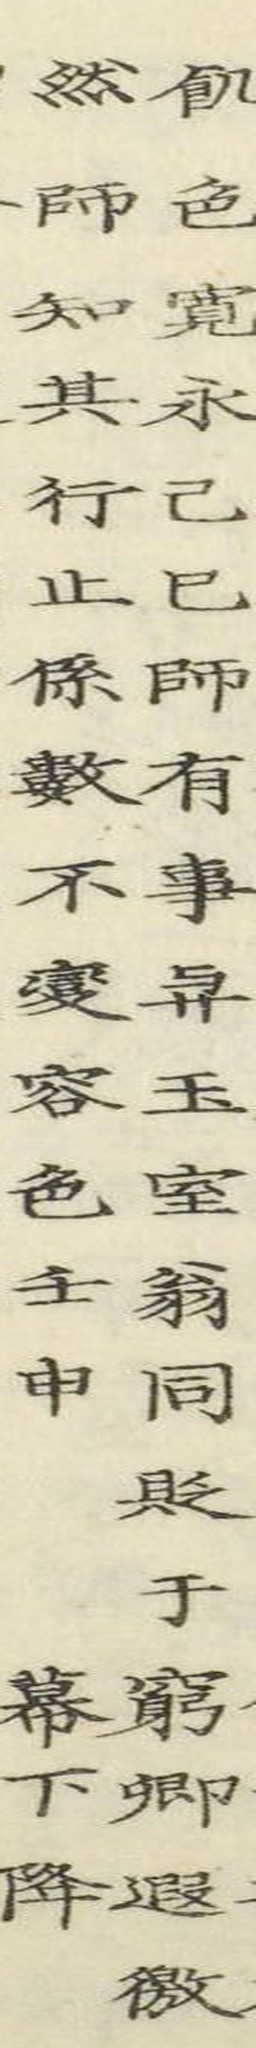然師知其行止係數不變容色壬申幕下降
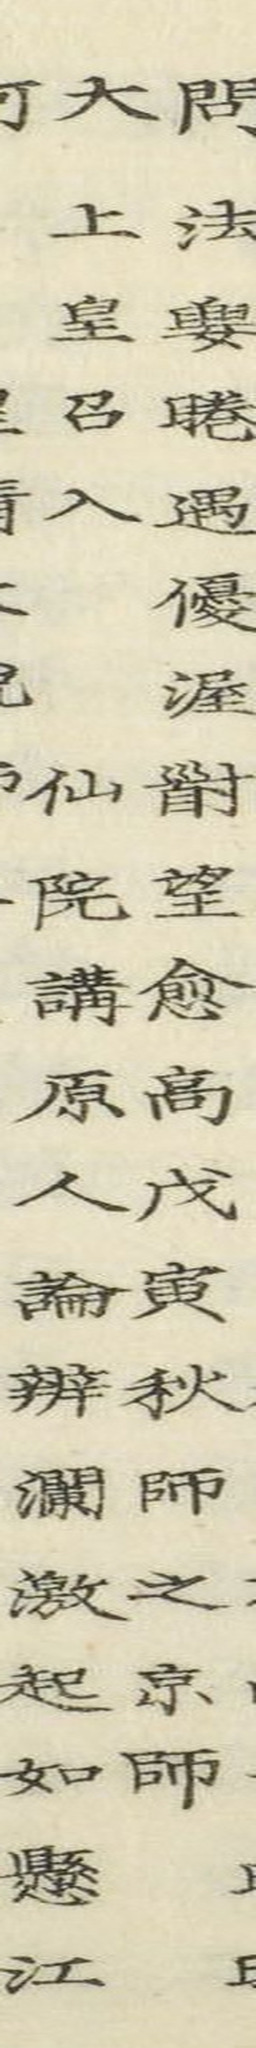大上皇召入仙院講原人論辨瀾激起如懸江
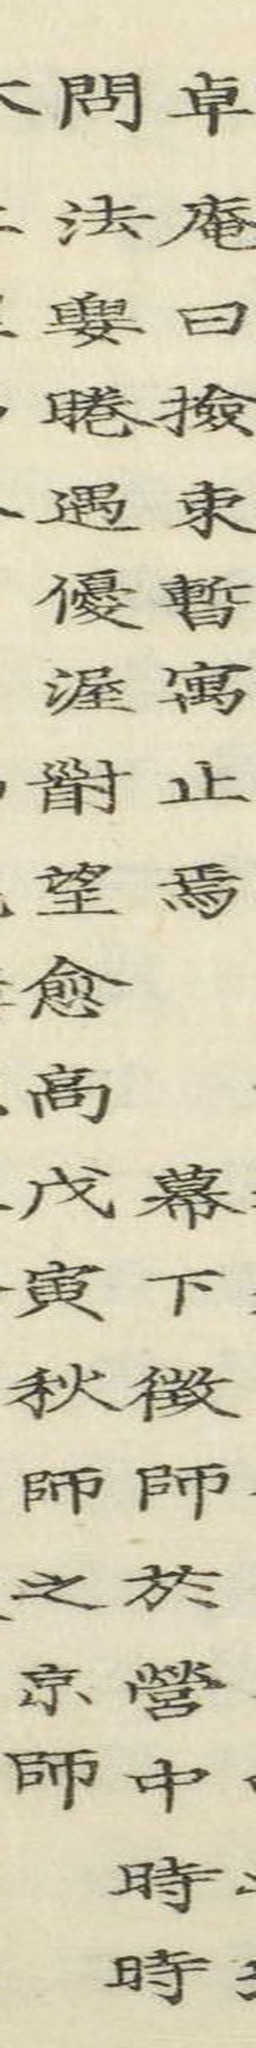問法𡢗睠遇優渥𡬹望愈高戊寅秋師之京師
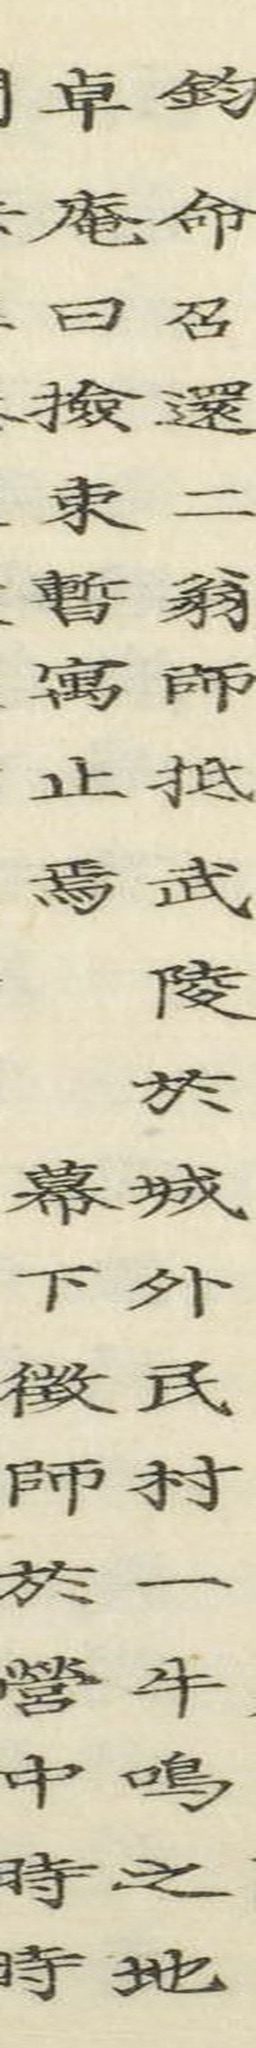卓庵曰撿束暫寓止焉幕下徵師於營中時時
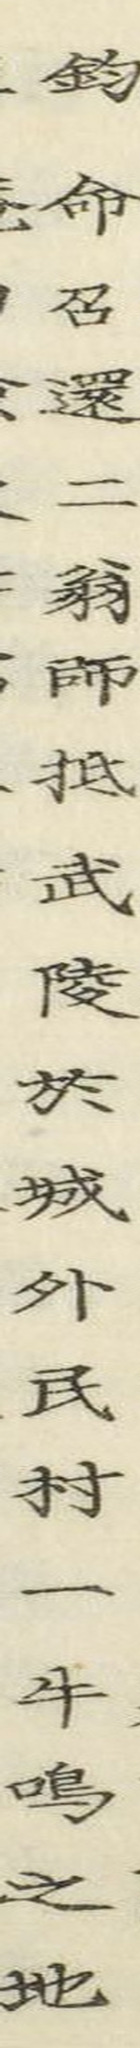鈞命召還二翁師抵武陵於城外民村一牛鳴之地
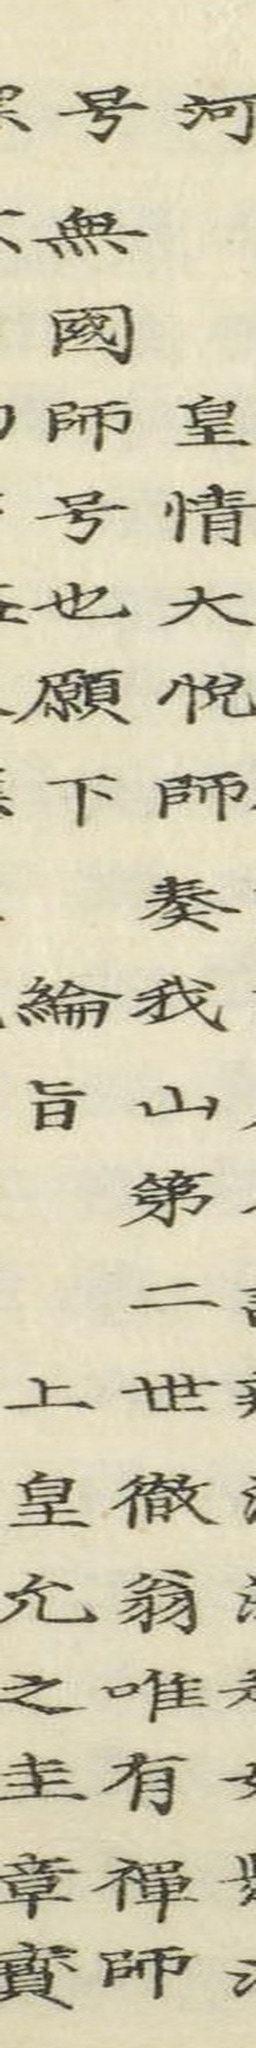号無國師号也願下綸旨上皇允之圭章寳
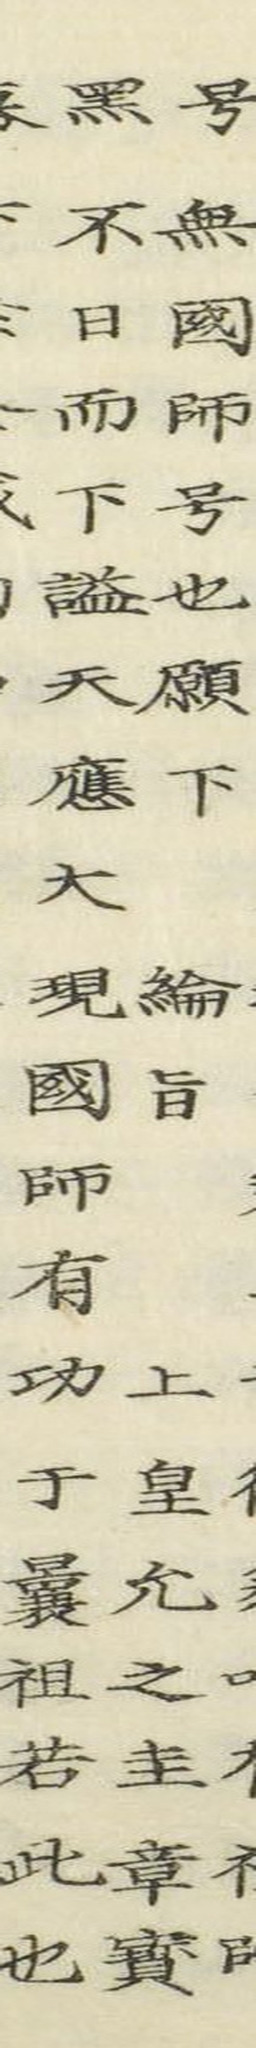黑不日而下謚天應大現國師有功于曩祖若此也
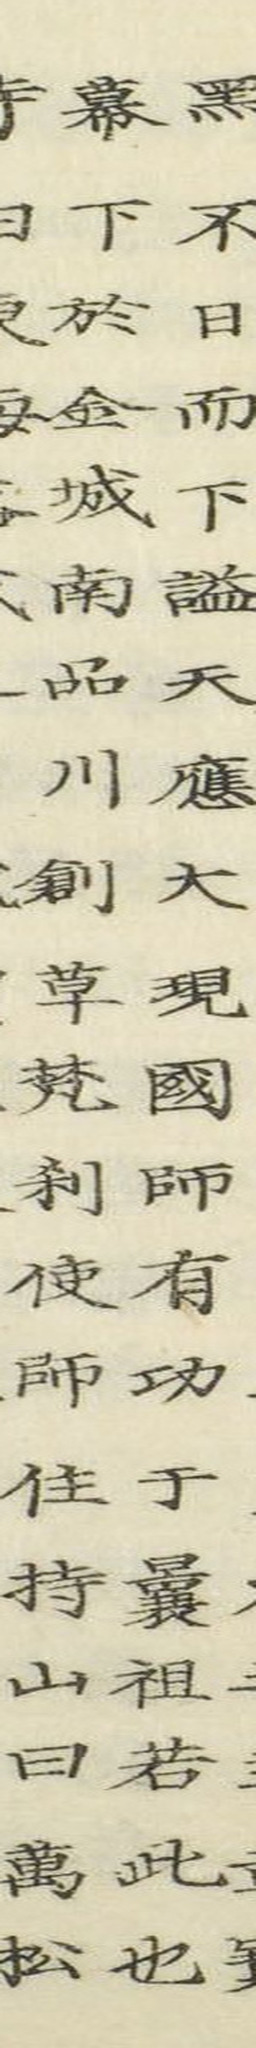幕下於金城南品川創草梵刹使師住持山曰萬松
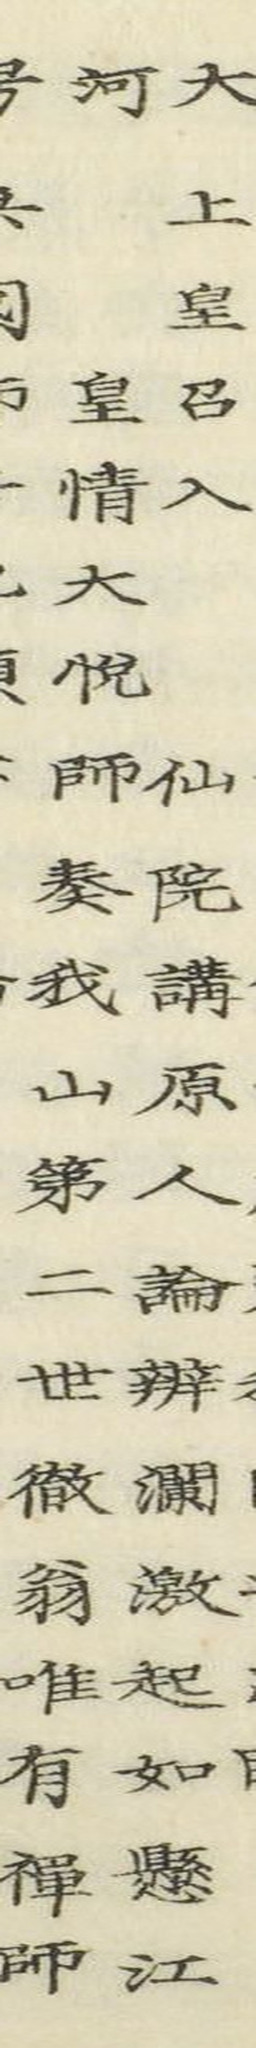河皇情大悅師奏我山第二世徹翁唯有禪師
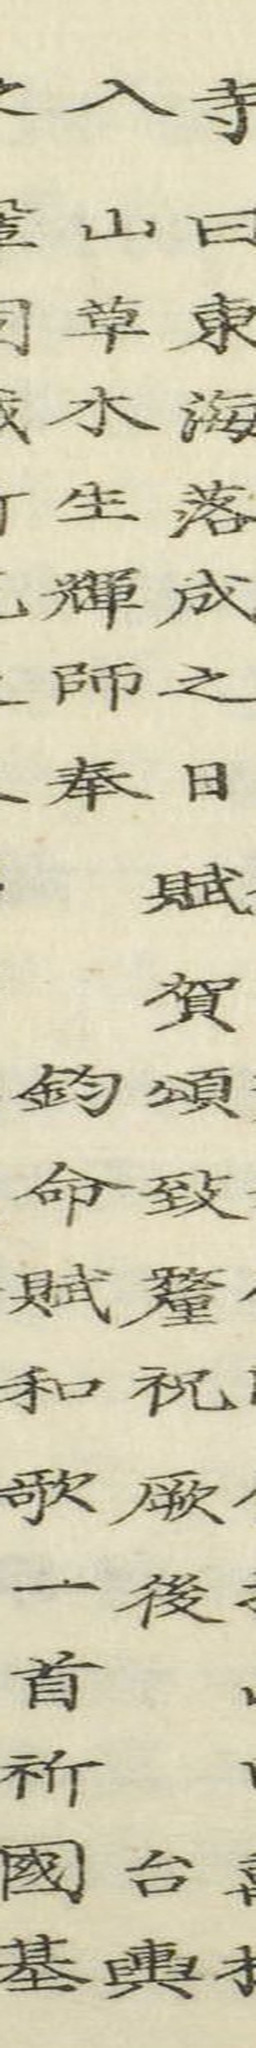入山草木生輝師奉鈞命賦和歌一首祈國基
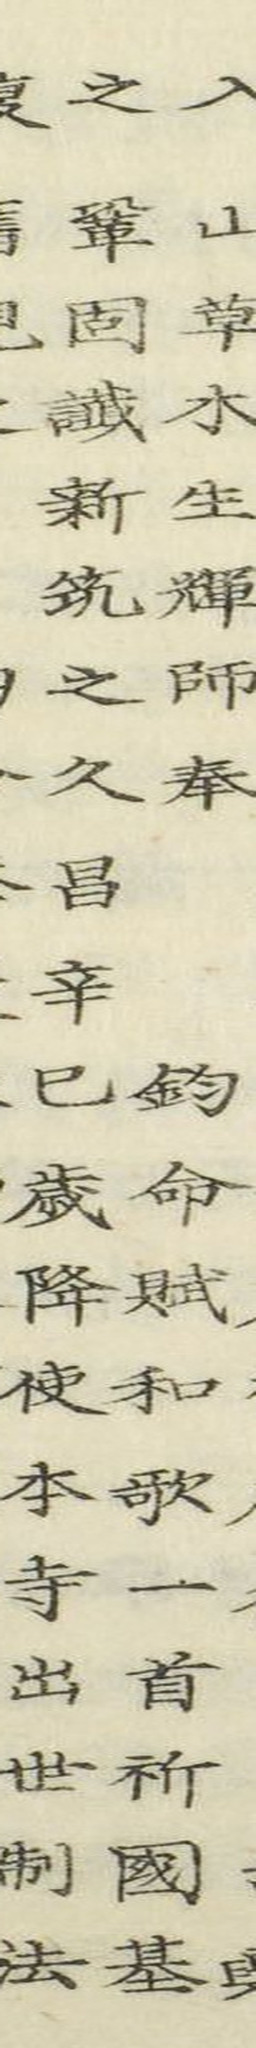之鞏固䜟新筑之久昌辛巳歲降使本寺出世制法
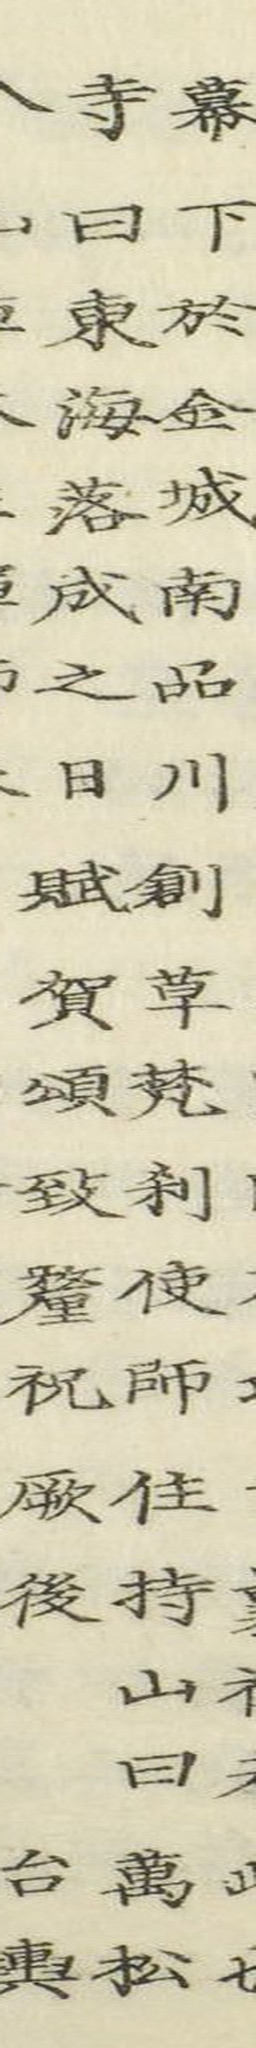寺曰東海落成之日賦賀頌𦤺𨤲祝厥後台輿
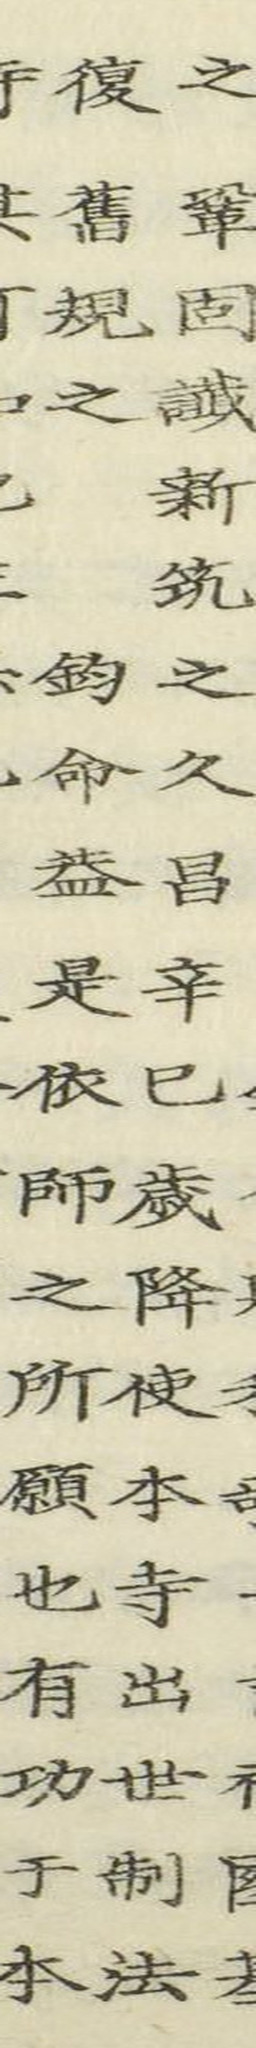復𦾔規之鈞命葢是依師之所願也有功于本
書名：江戸名所図会 20巻 巻之4
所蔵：東京学芸大学教育コンテンツアーカイブ
